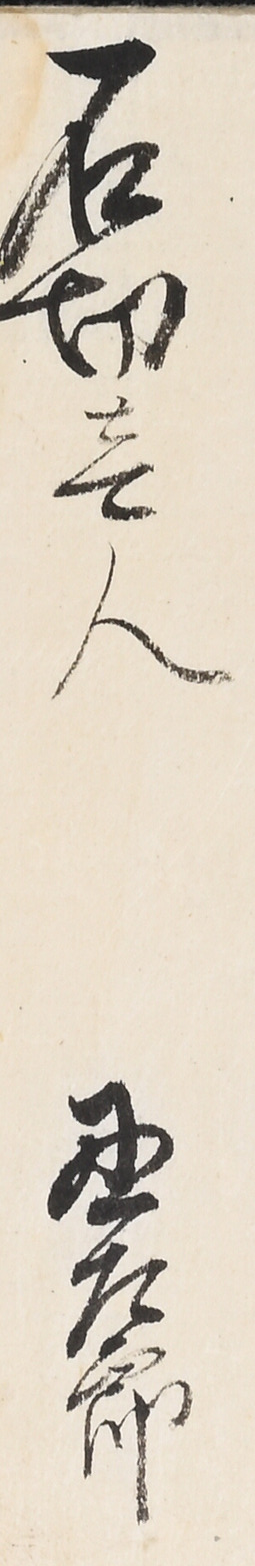石切壱人作右衛門
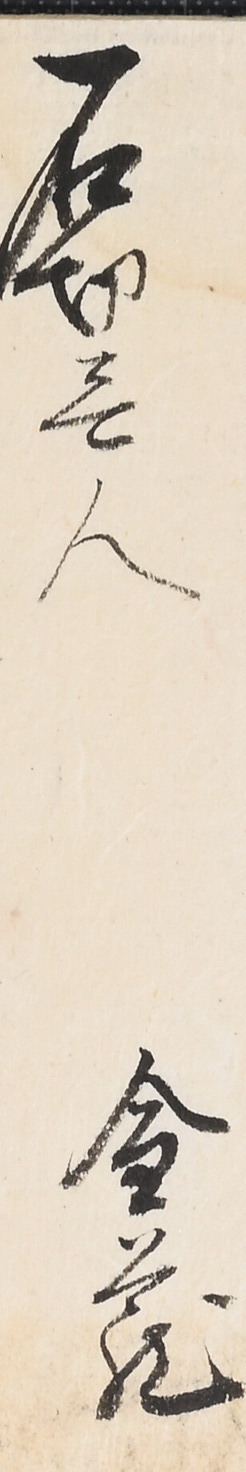石切壱人金蔵
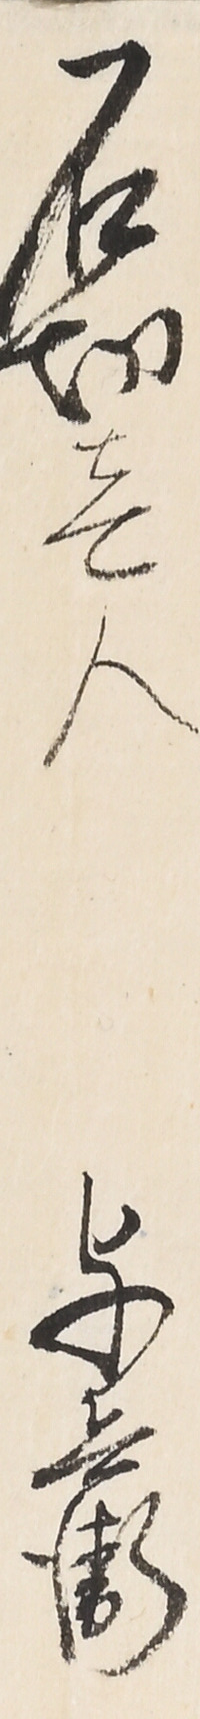石切壱人与兵衛
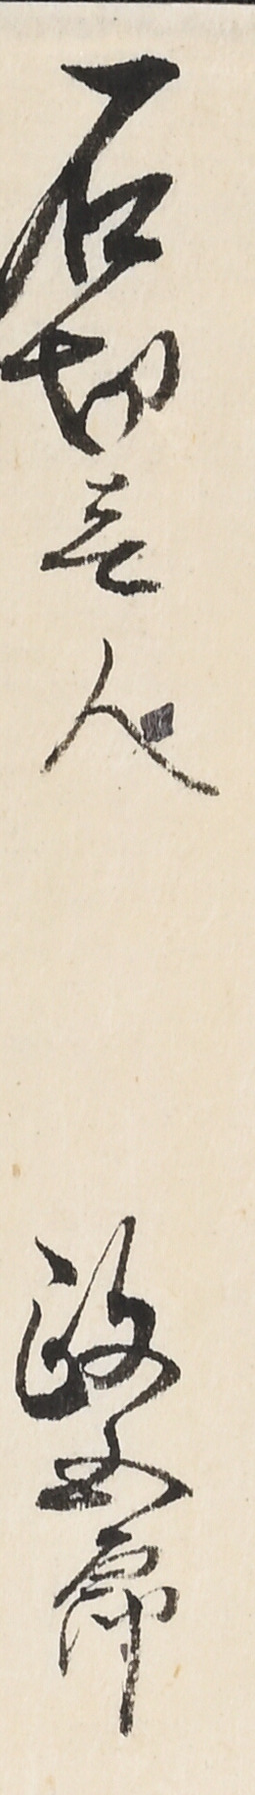石切壱人政五郎
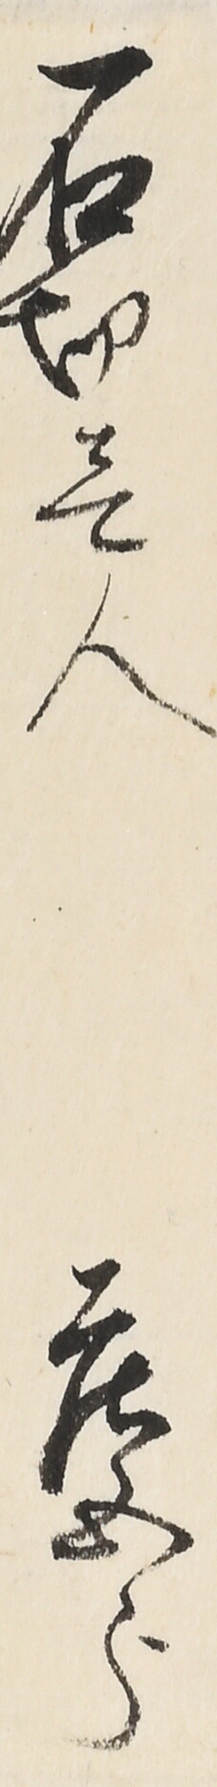石切壱人庄五郎
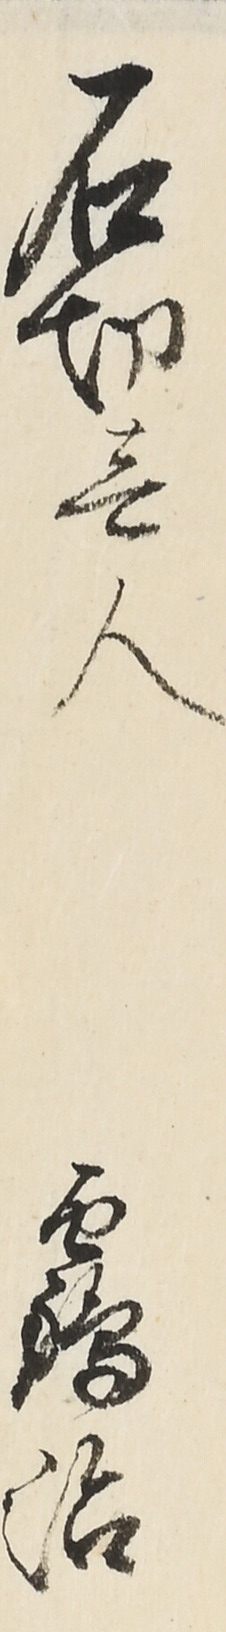石切壱人鶴治
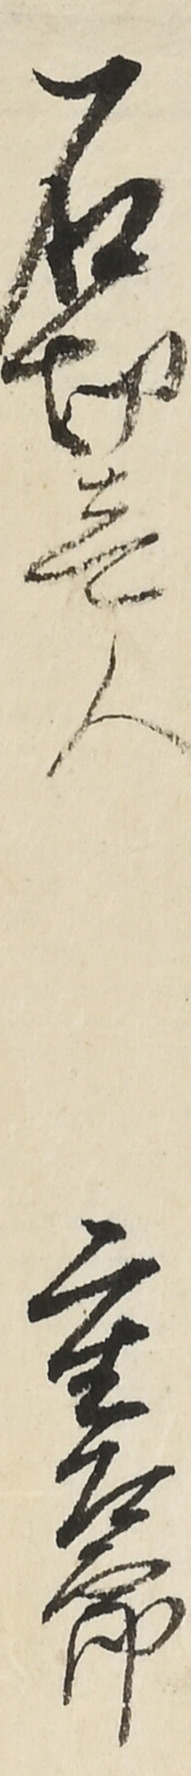石切壱人庄太郎
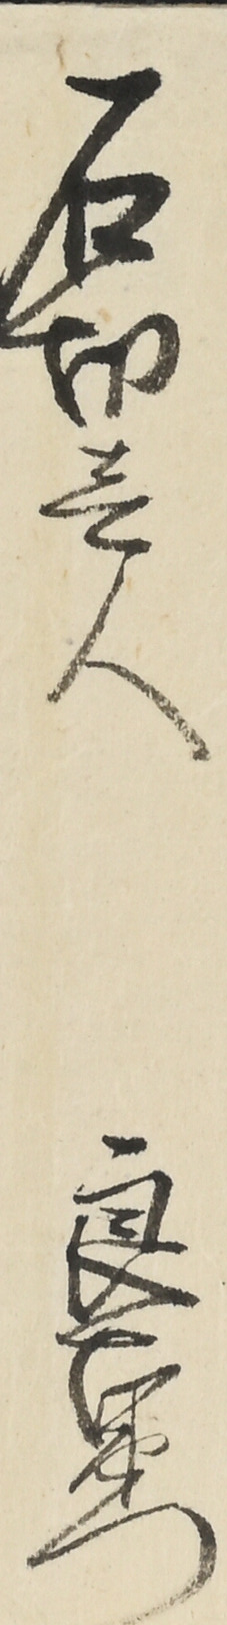石切壱人良右衛門
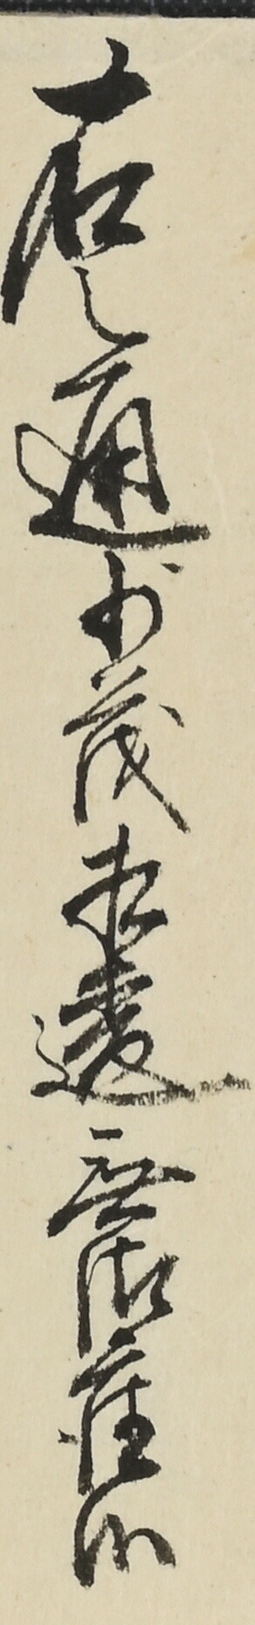右之通少茂相違無御座候

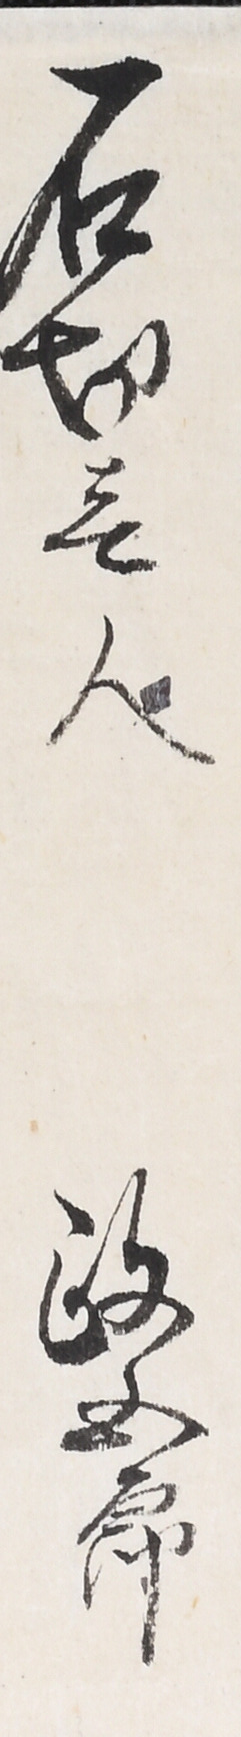石切壱人政五郎
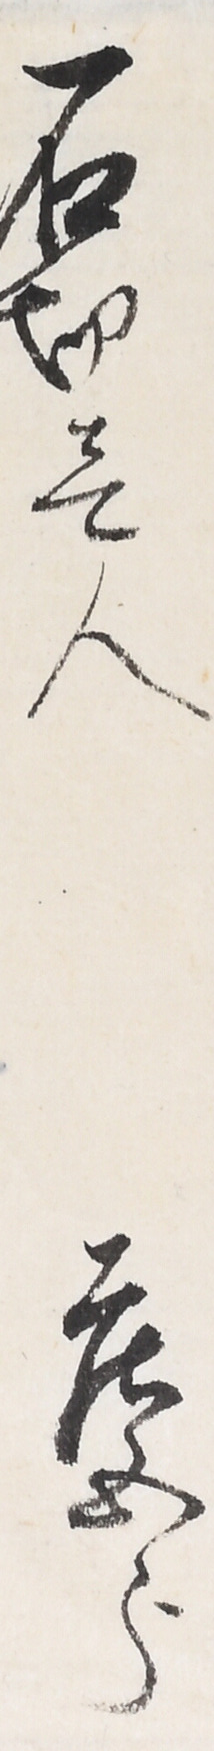石切壱人庄五郎
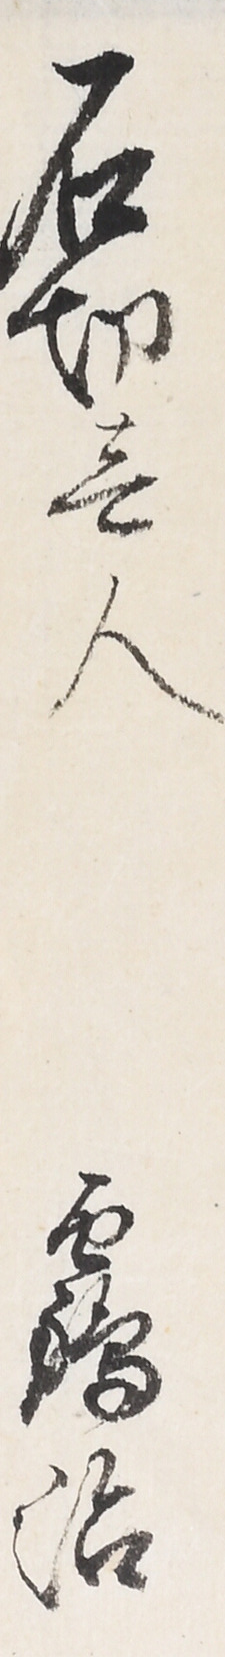石切壱人鶴治
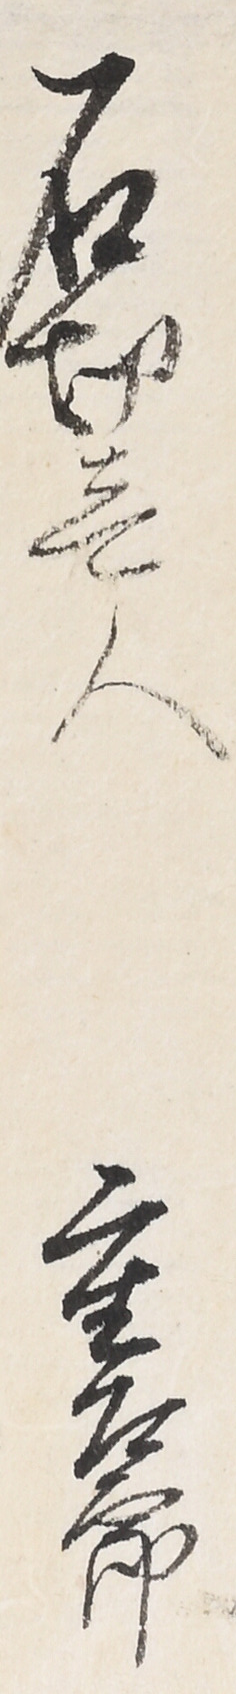石切壱人良右衛門
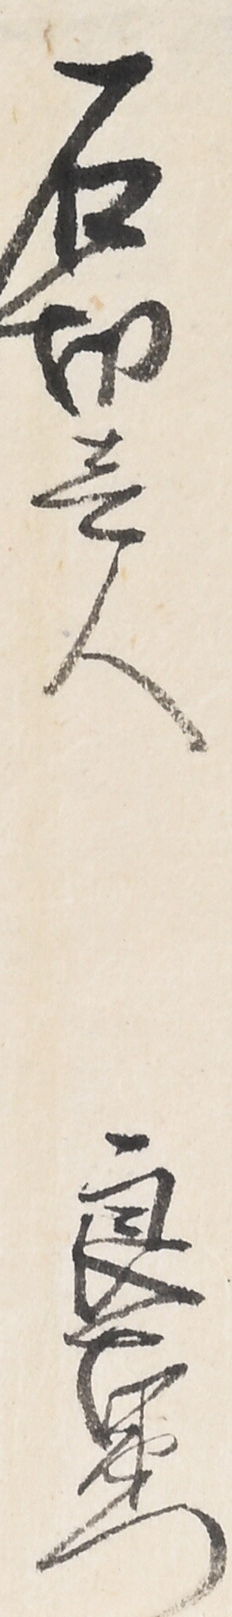石切壱人良右衛門
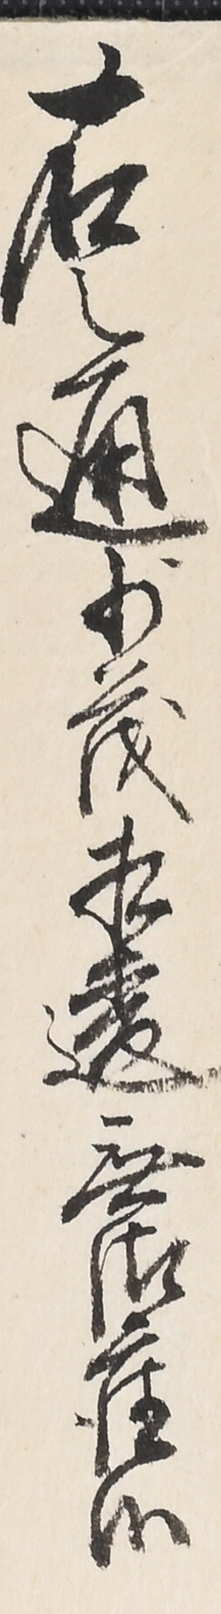右之通少茂相違無御座候
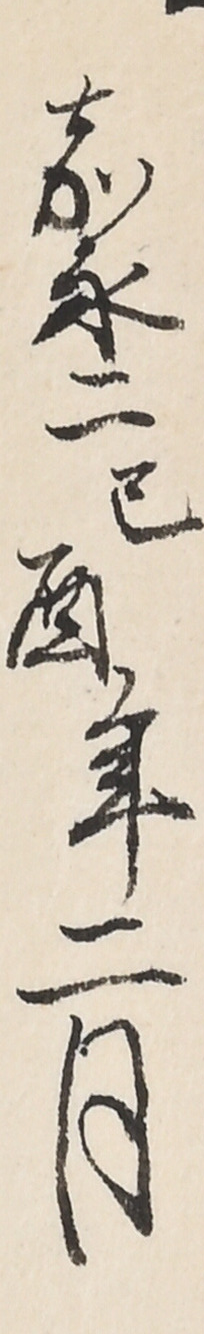嘉永二己酉年二月
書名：嘉永二巳酉年二月他國出石切名前書上帳
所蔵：伊那市立高遠町図書館・合同会社AMANE
